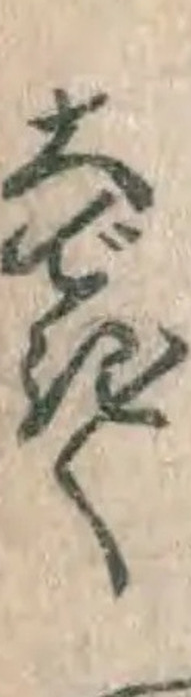大でき〳〵

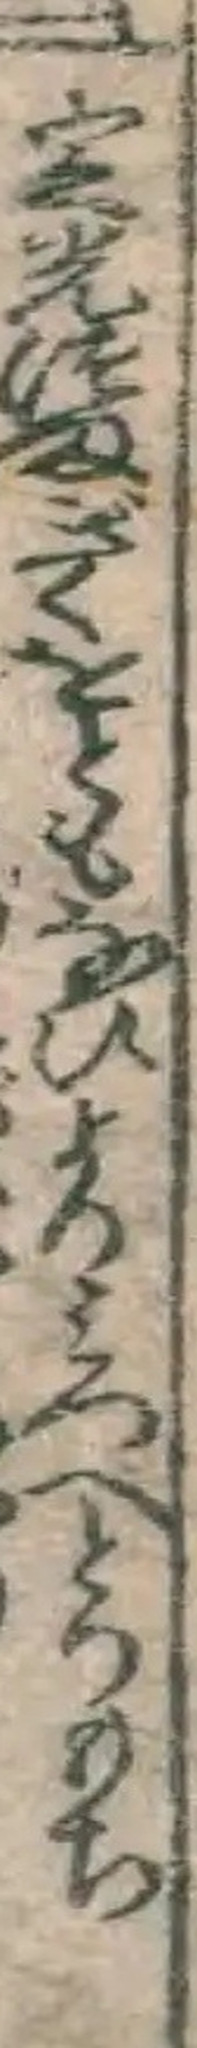定光つまぎくをともなひよりみつへとりもち
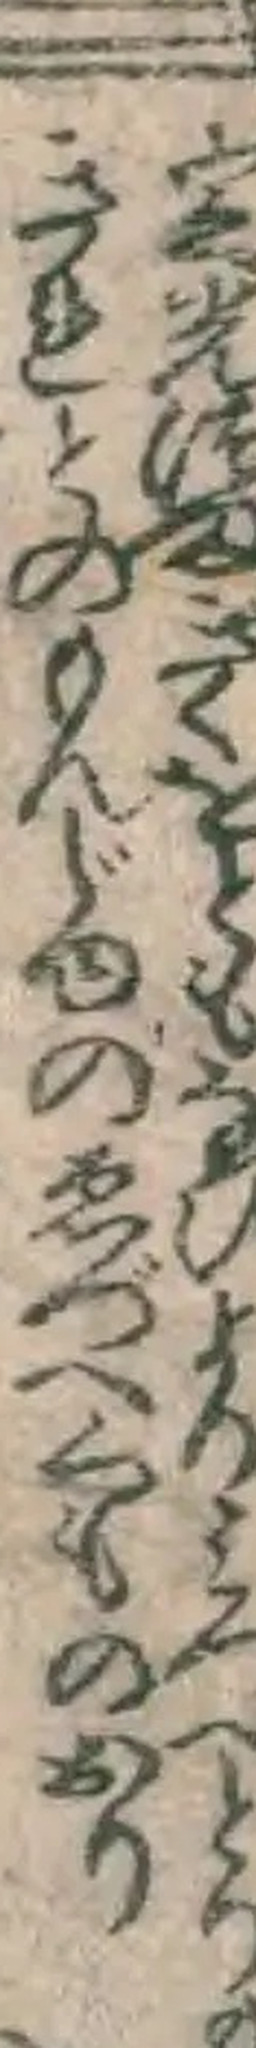きれとのもんじゆのゑづへくものおり
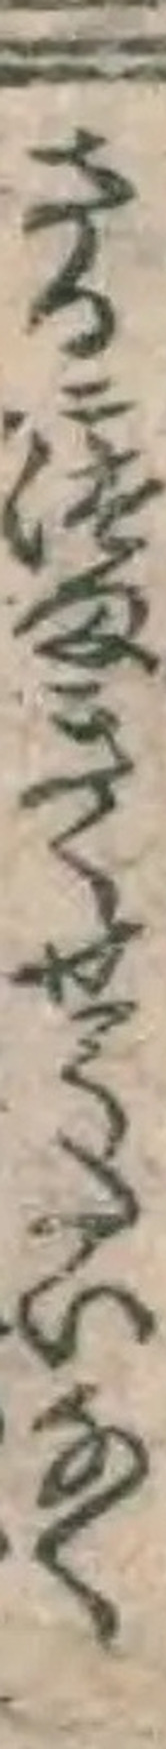さるにつまきくせうたいなく
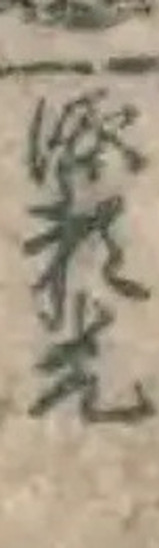源頼光
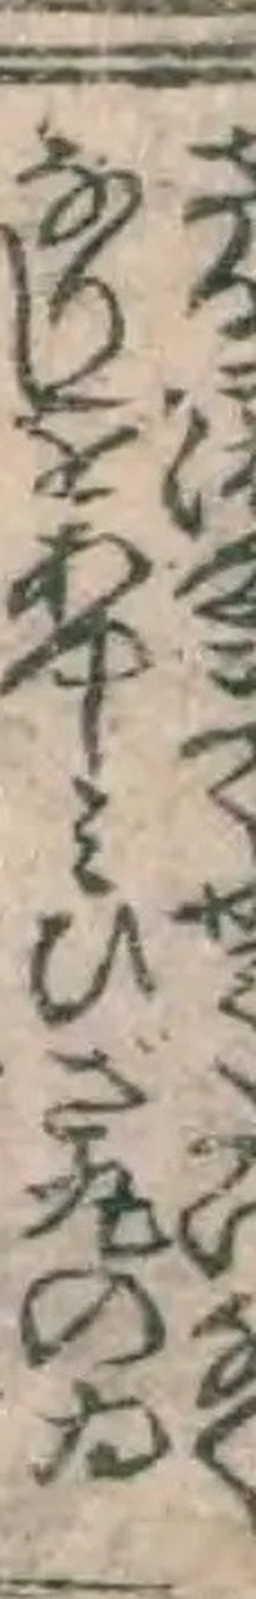なりしをあやしみひざ丸のゐ
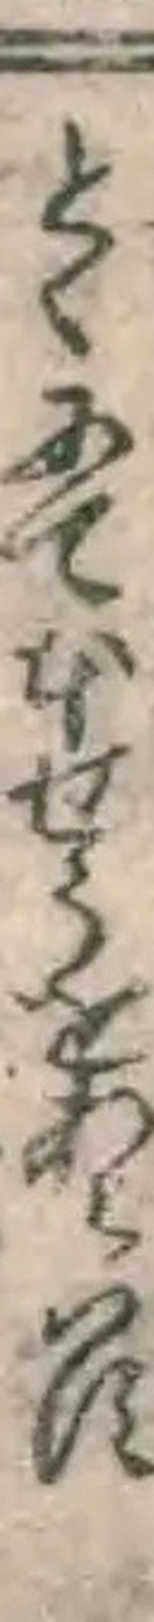とくにて本せうをあらはす
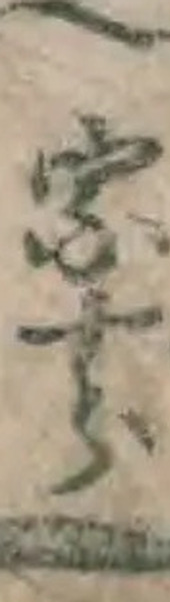宗十郎
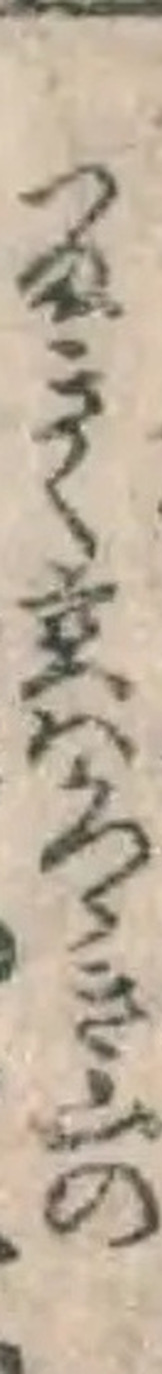つまきく実はかつらき山の
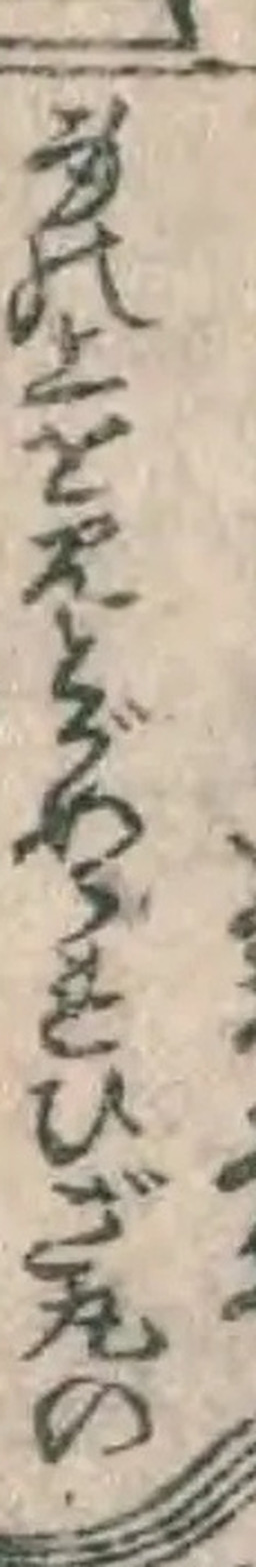身の上を見とがめられひざ丸の
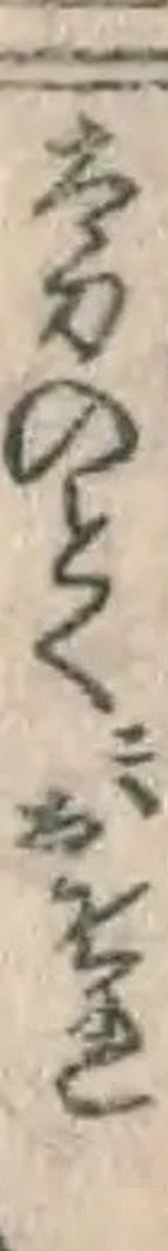太刀のとくにおそれ
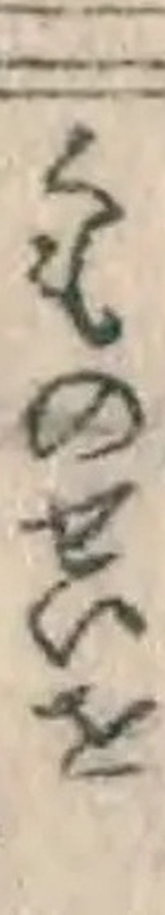くものせいを
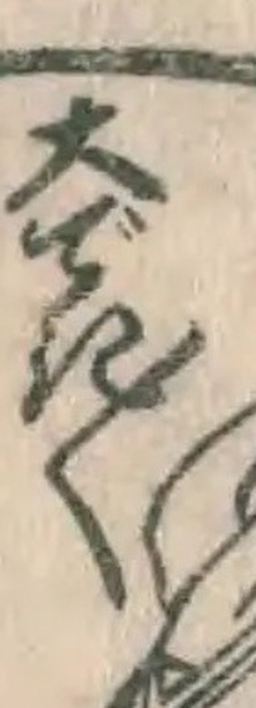大でき〳〵
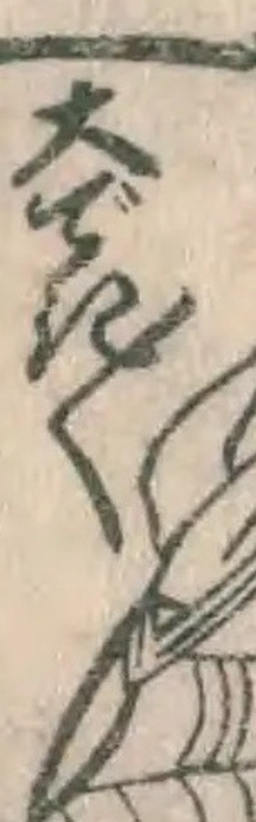大でき〳〵
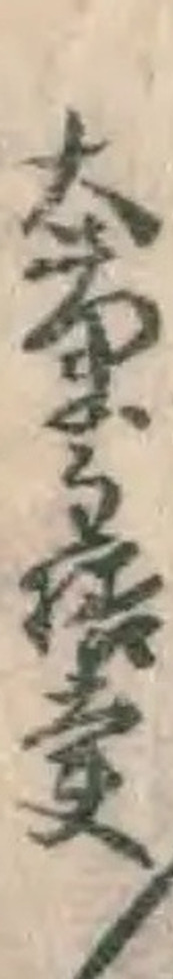大さつま主膳太夫
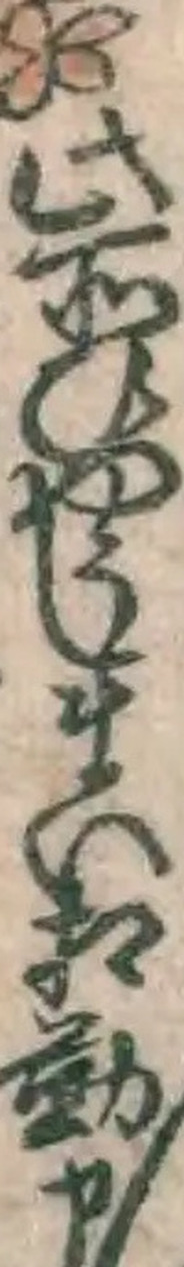此所ひやうしまい相動申候
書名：四天王宿直着綿
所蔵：国立国会図書館 National Diet Library, JAPAN
